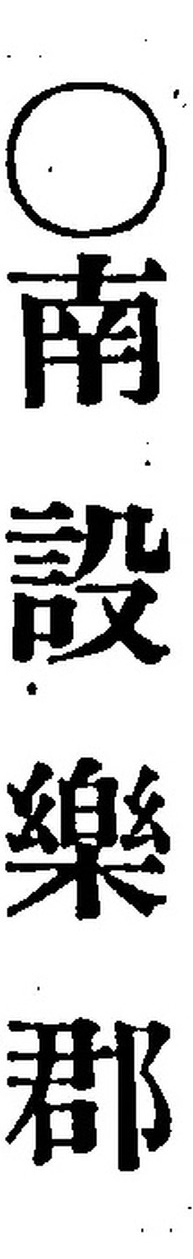○南設楽郡
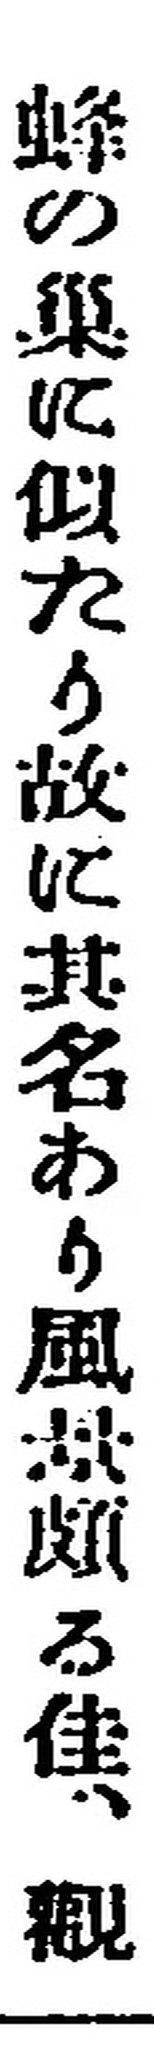蜂の巣に似たり故に其名あり風景頗る佳、観
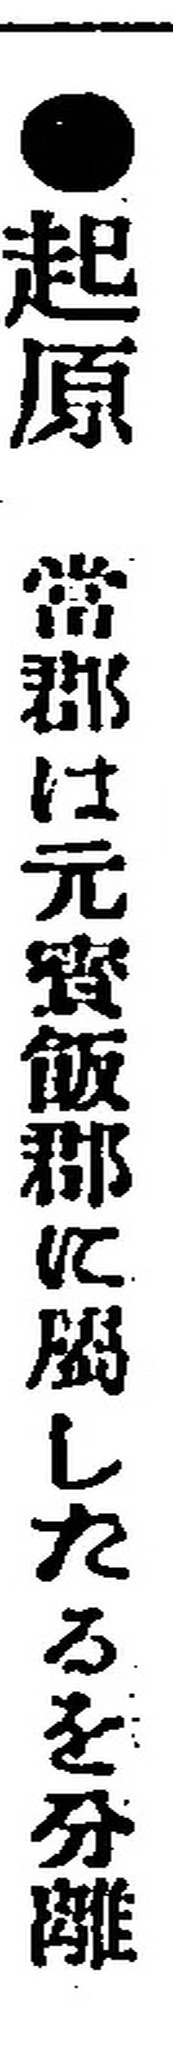●起原当郡は元宝飯郡に属したるを分離
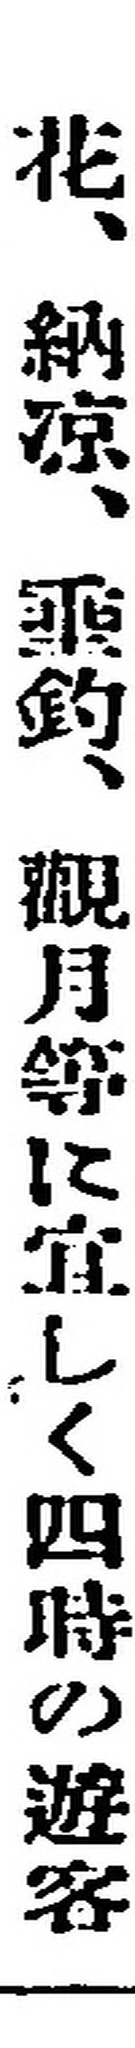花、納涼、垂釣、観月等に宜しく四時の遊客
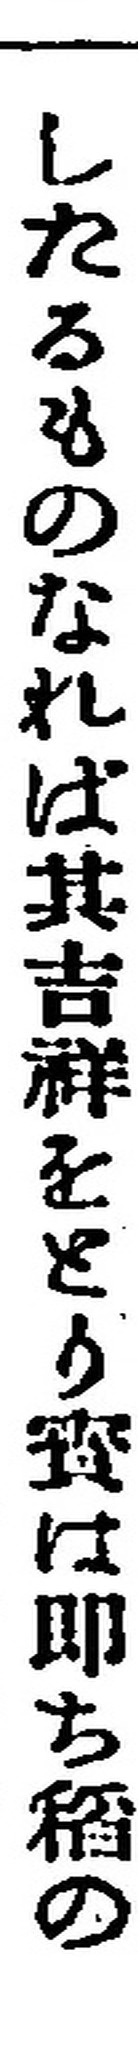したるものなれば其吉祥をとり宝は即ち稲の
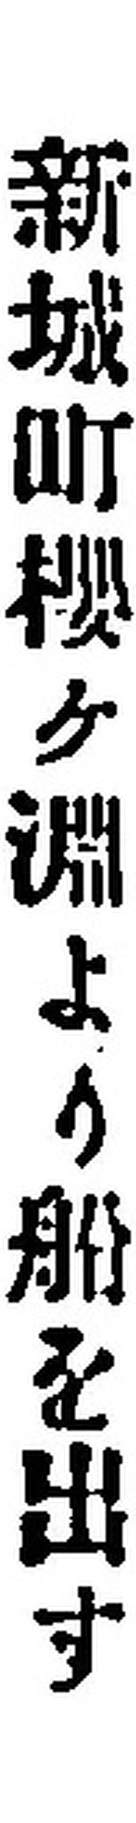新城町桜ヶ淵より船を出す
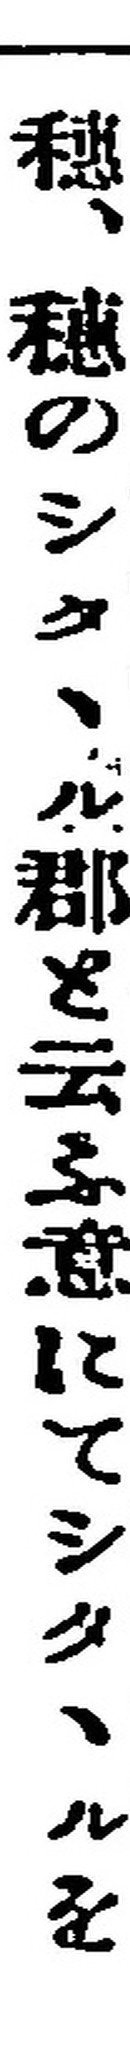穂、穂のシタヽル郡と云ふ意にてシタヽルを
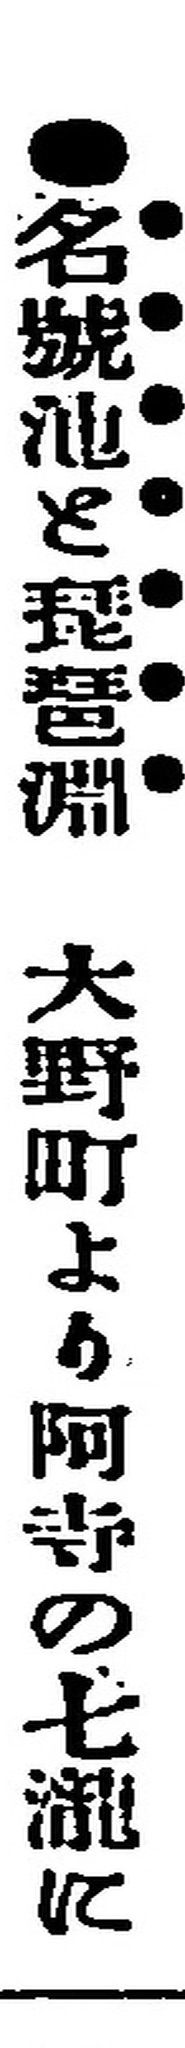●名号池と琵琶淵大野町より阿寺の七瀧に
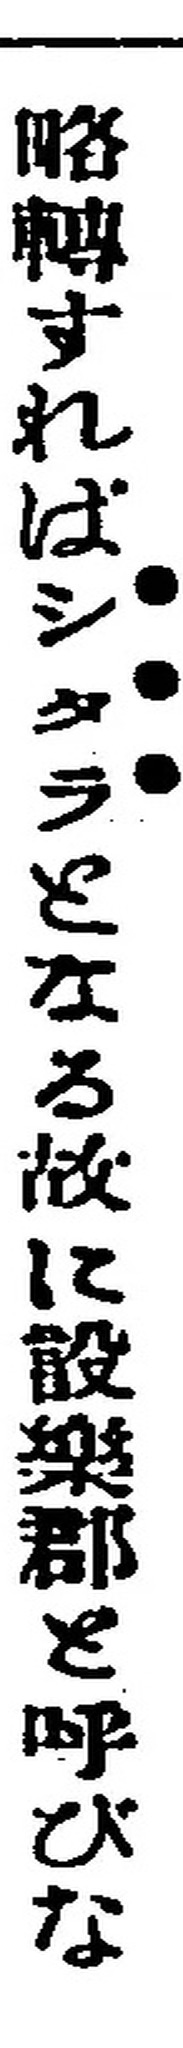略転すればシタラとなる故に設楽郡と呼びな
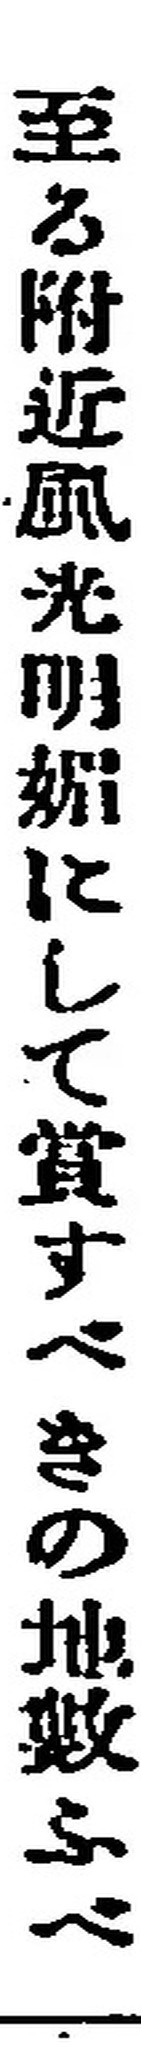至る附近風光明媚にして賞すべきの地数ふべ
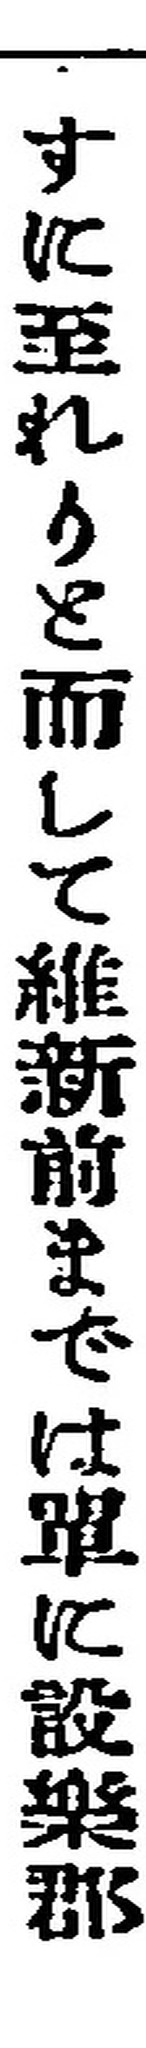すに至れりと而して維新前までは単に設楽郡
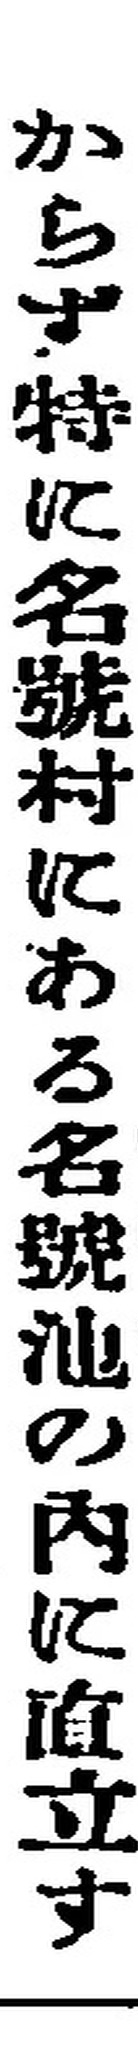からず特に名号村にある名号池の内に直立す
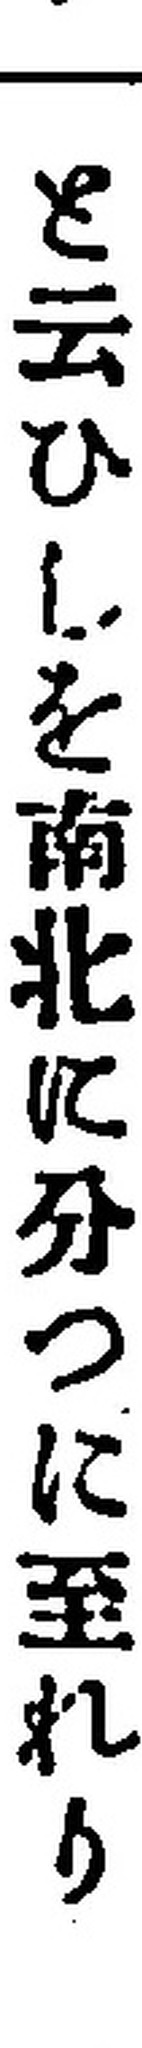と云ひしを南北に分つに至れり
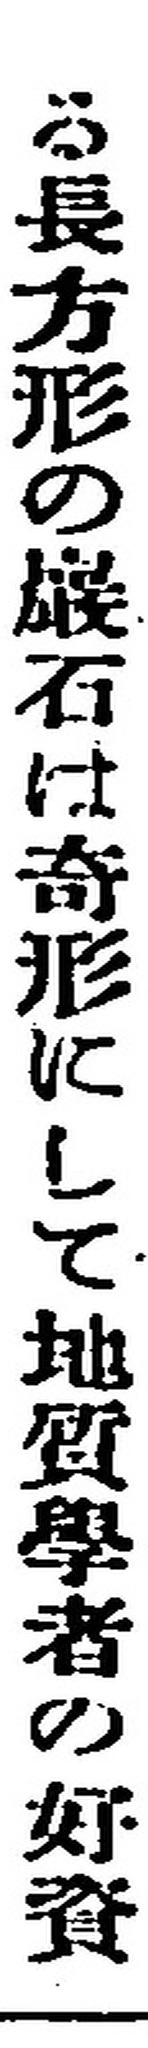る長方形の巌石は奇形にして地質学者の好資
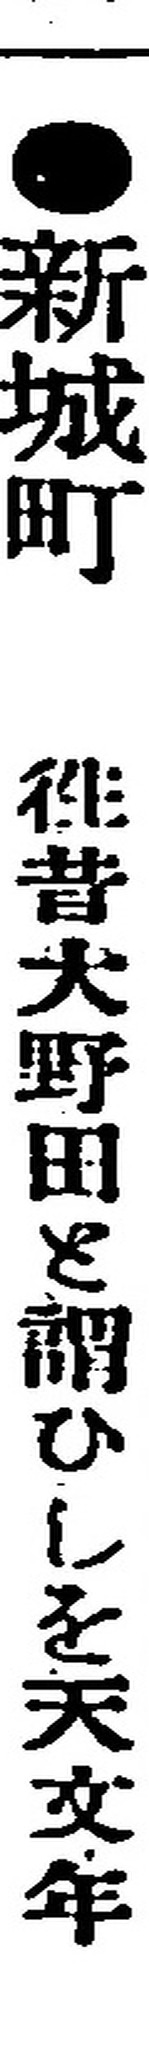●新城町往昔大野田と謂ひしを天文年
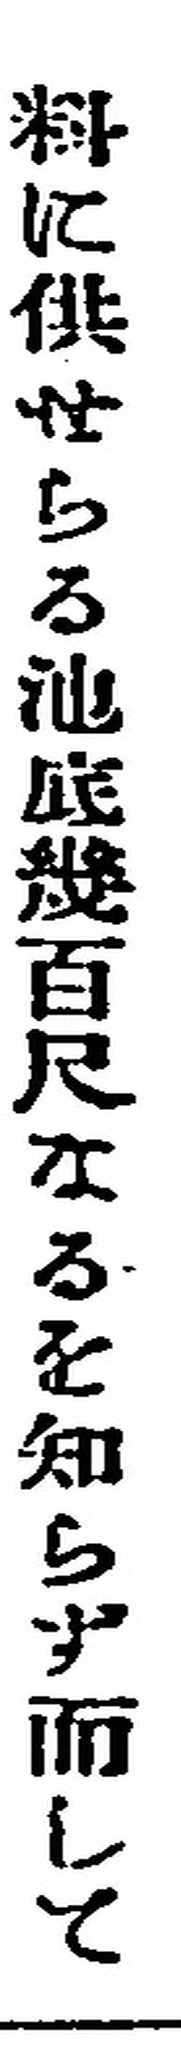料に供せらる池底幾百尺なるを知らず而して
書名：東参名勝案内
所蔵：国立国会図書館 National Diet Library, JAPAN
